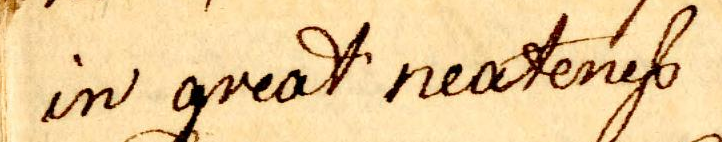in great neateness
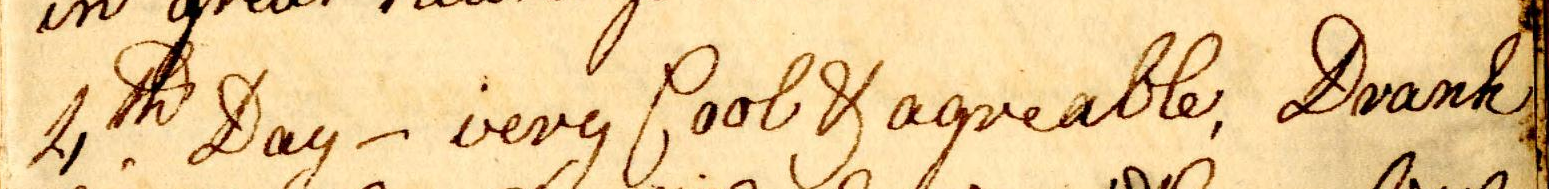4^th Day- very Cool & agreable, Drank
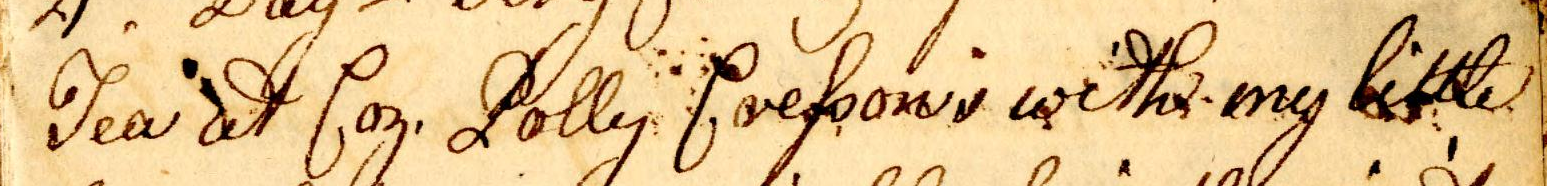Tea at Coz. Polly Cresson's with my little
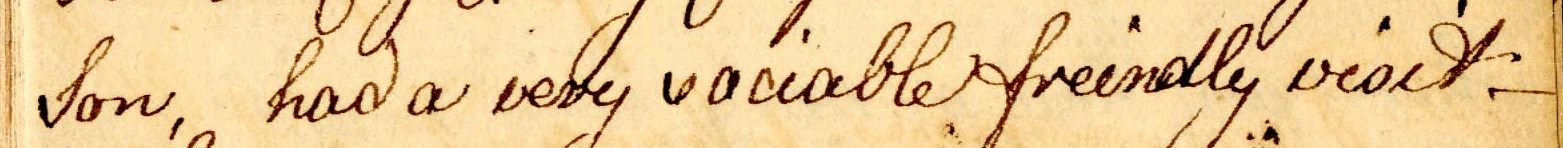Son, had a very sociable freindly visit-
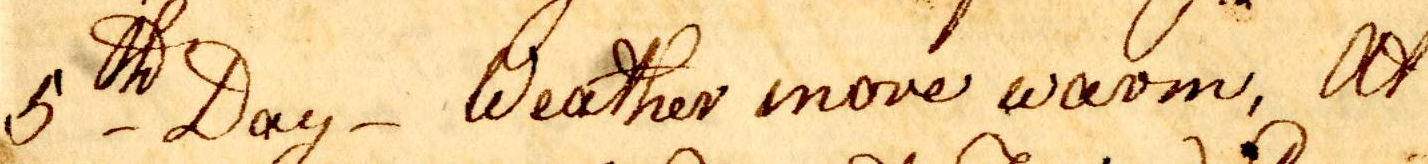5^th Day- Weather more warm, At
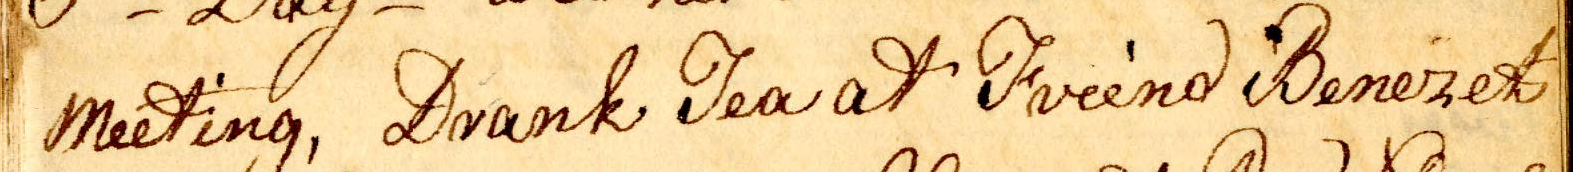Meeting, Drank Tea at Friend Benezets
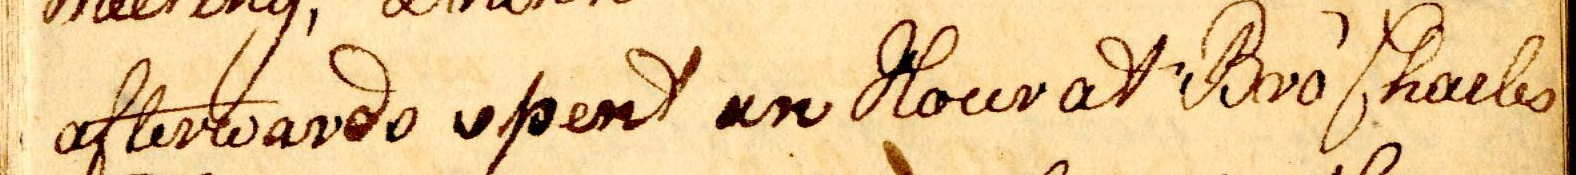afterwards spent an Hour at Bro' Charles
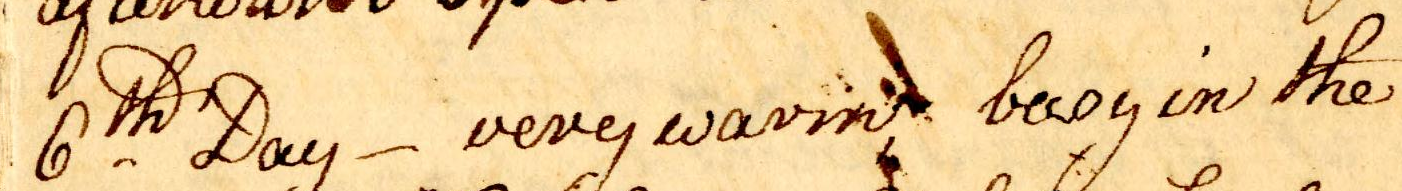6^th Day- very warm busy in the
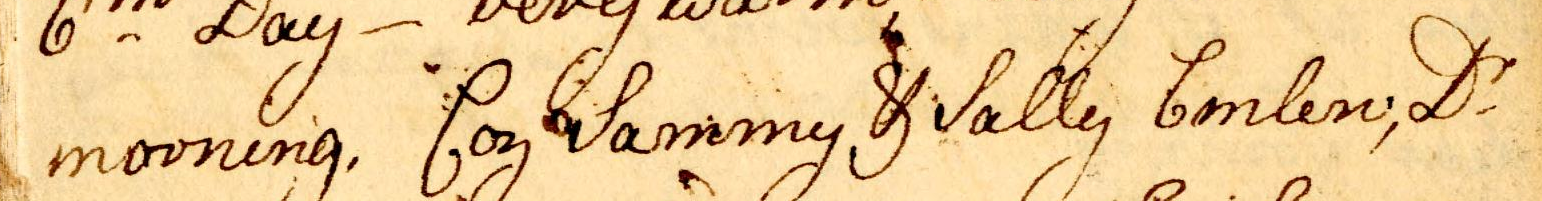morning, Coz Sammy & Sally Emlen, D^r
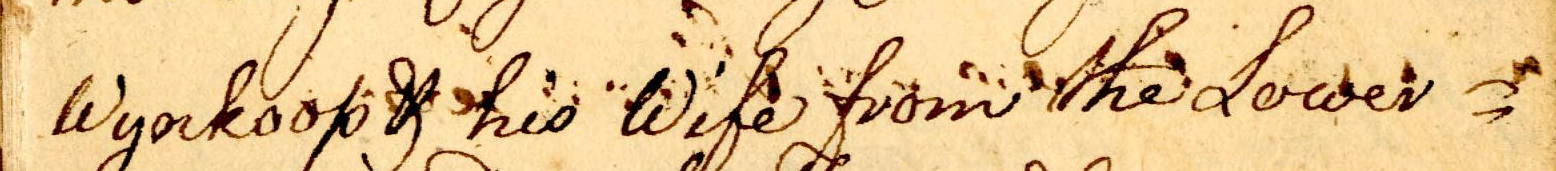Wynkoop & his Wife from the Lower-
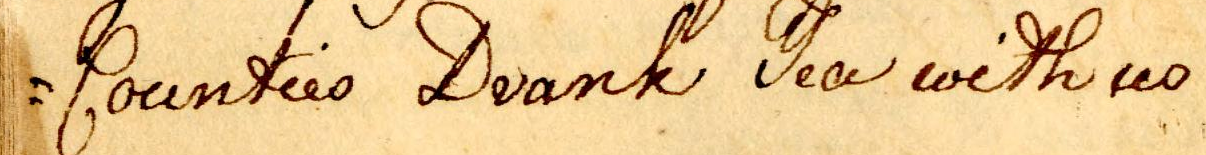-Counties Drank Tea with us
